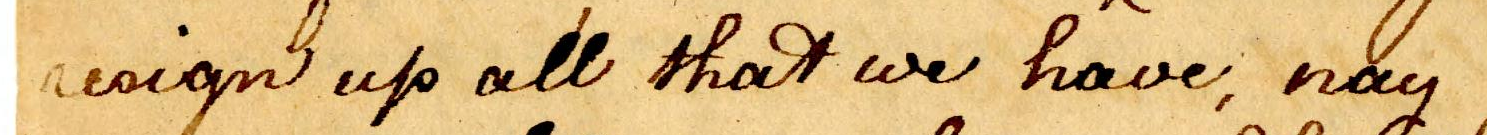resign up all that we have, nay
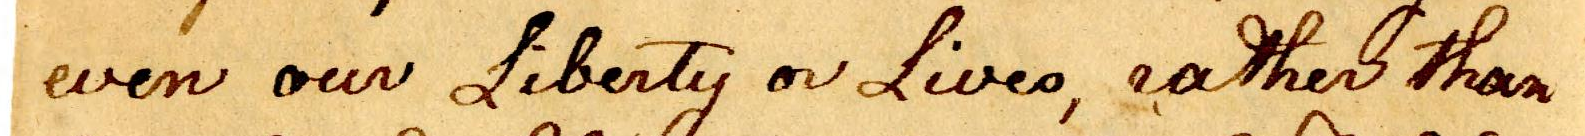even our Liberty or Lives, rather than
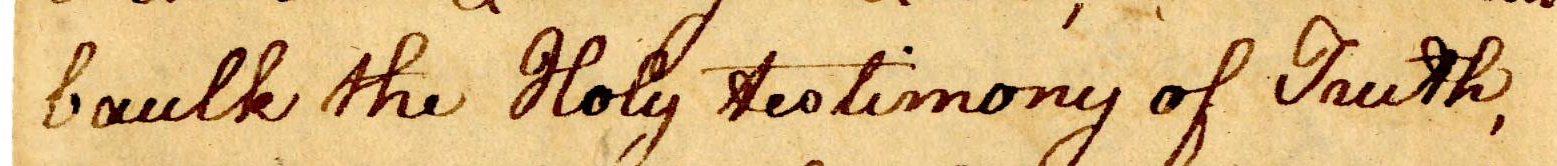baulk the Holy testimony of Truth,
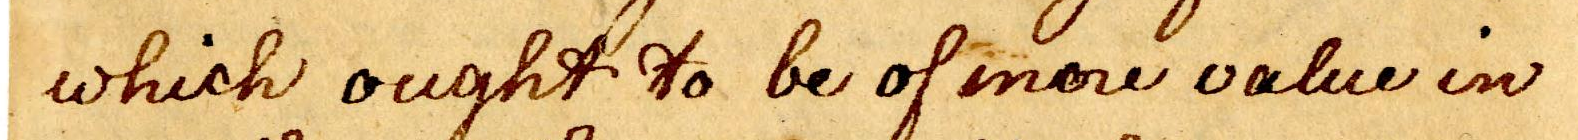which ought to be of more value in
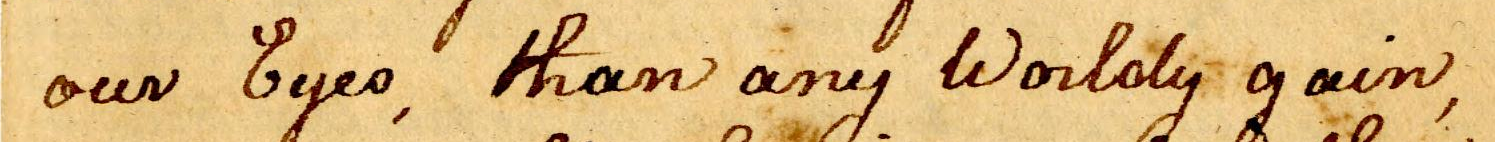our Eyes, than any Worldy gain,
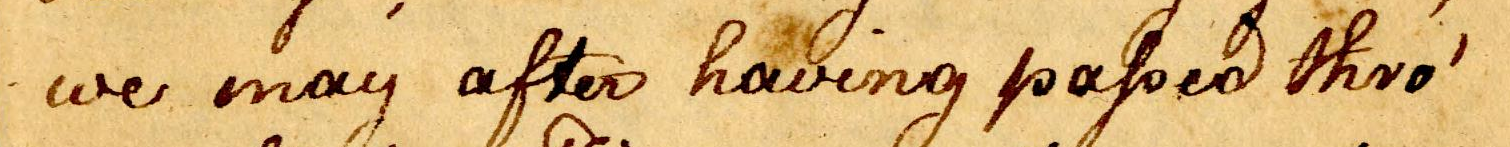we may after having passed thro'
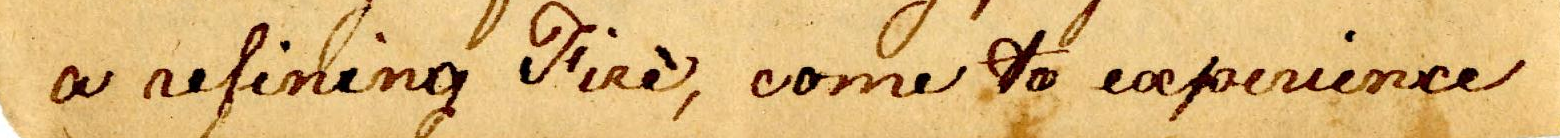a refining Fire, come to experience
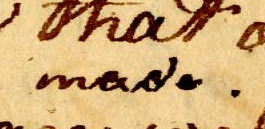made.
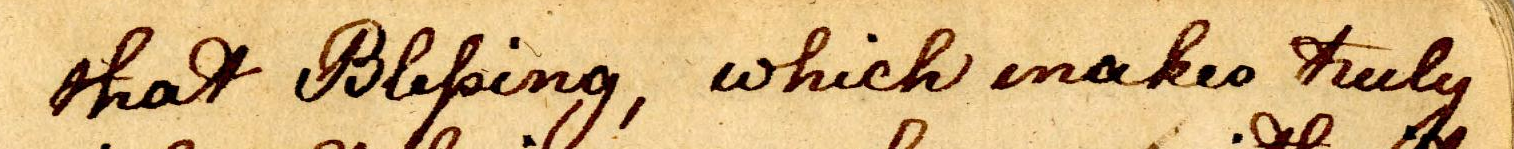that Blessing, which makes truly
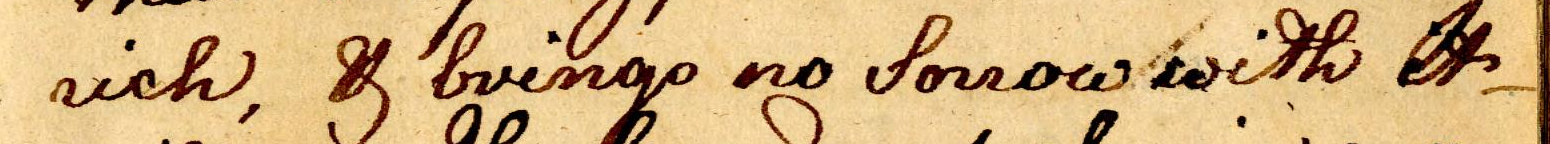rich, & brings no Sorrow with it -
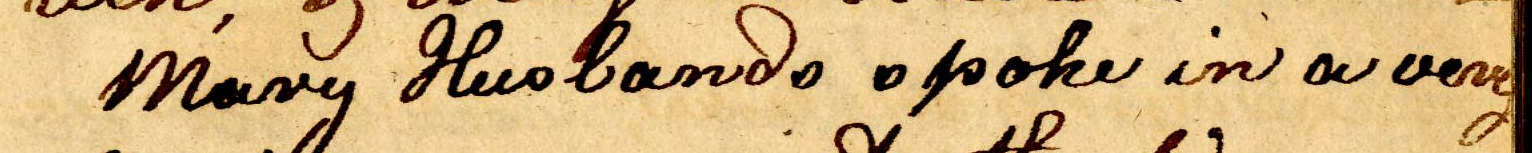Mary Husbands spoke in a very
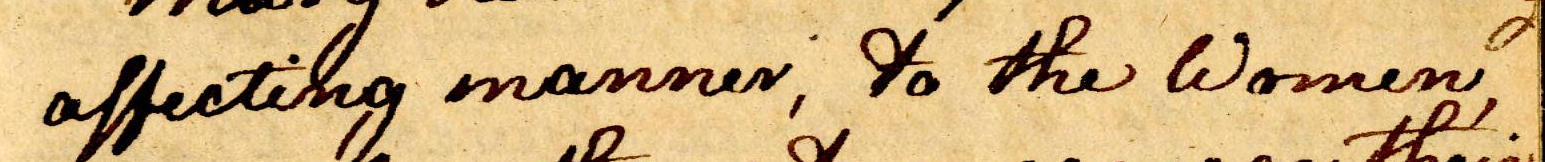affecting manner, to the Women
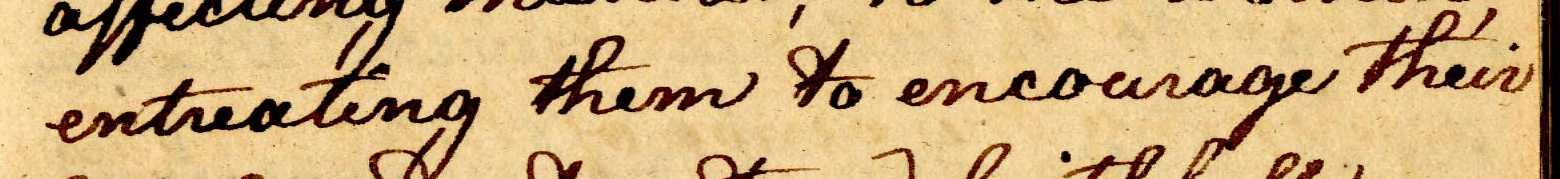entreating them to encourage their
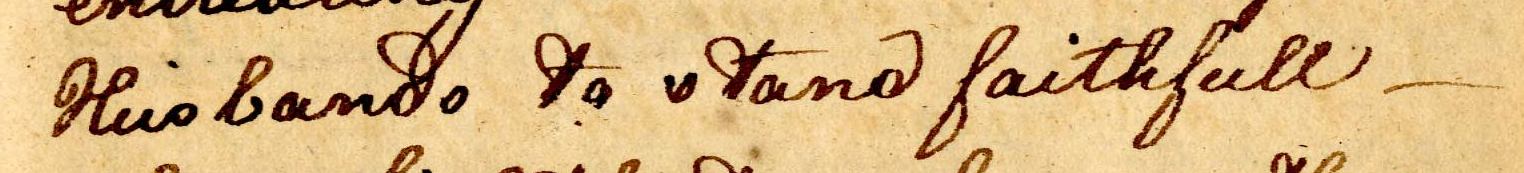Husbands to stand faithfull-
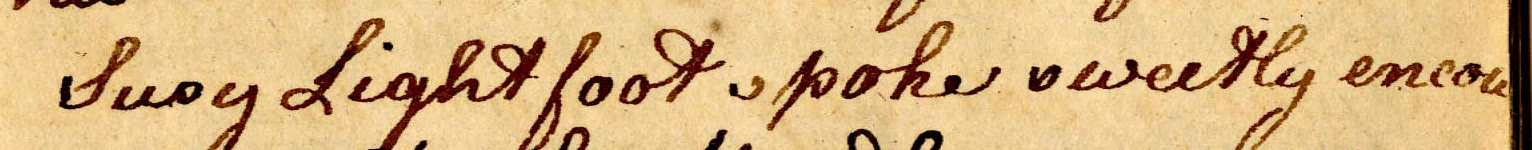Susy Lightfoot spoke sweetly encou
